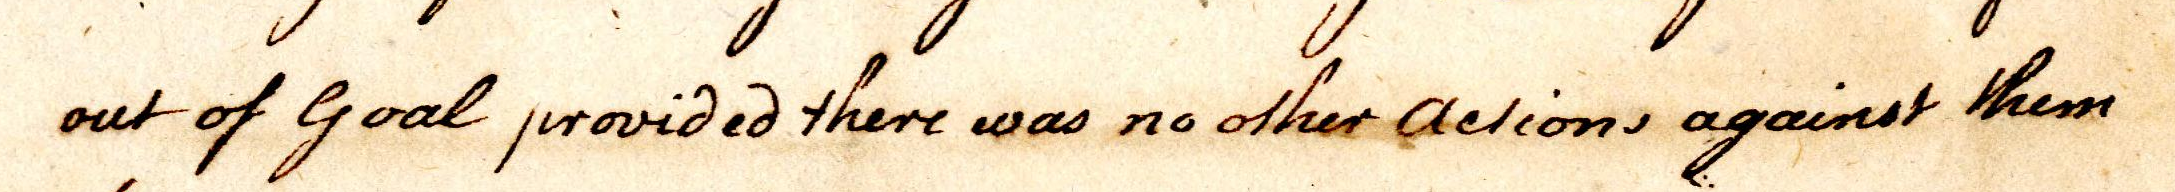out of Goal provided there was no other Actions against them
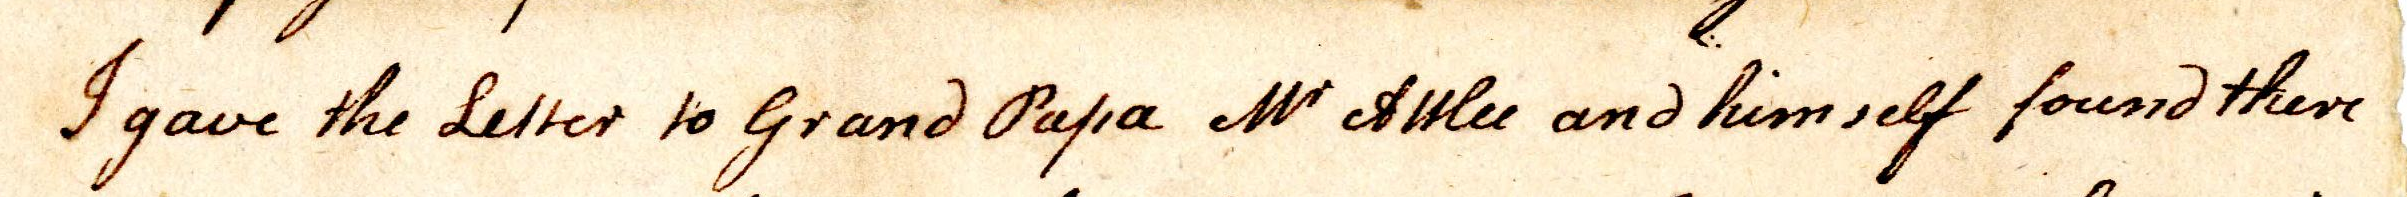I gave the Letter to Grand Papa M^r Attlee and himself found there
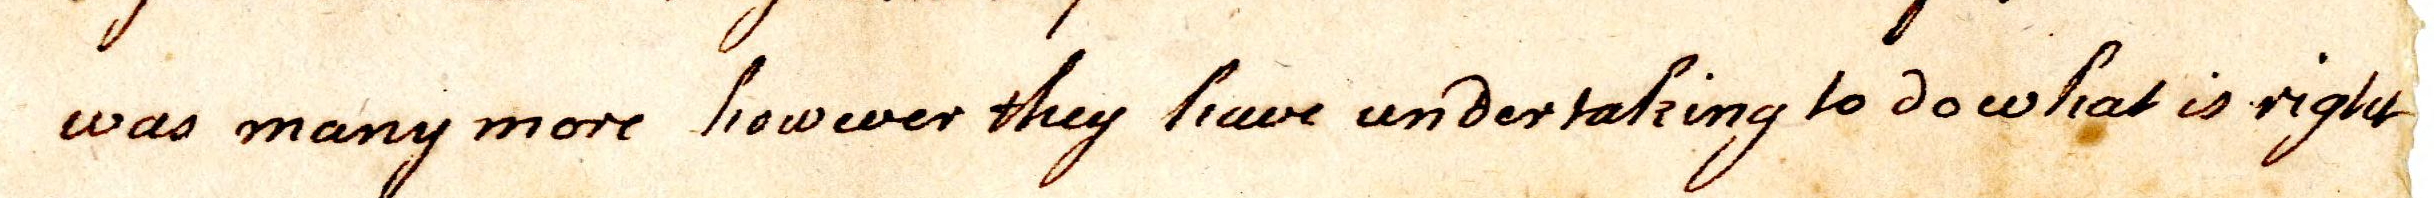was many more however they have undertaking to do what is right
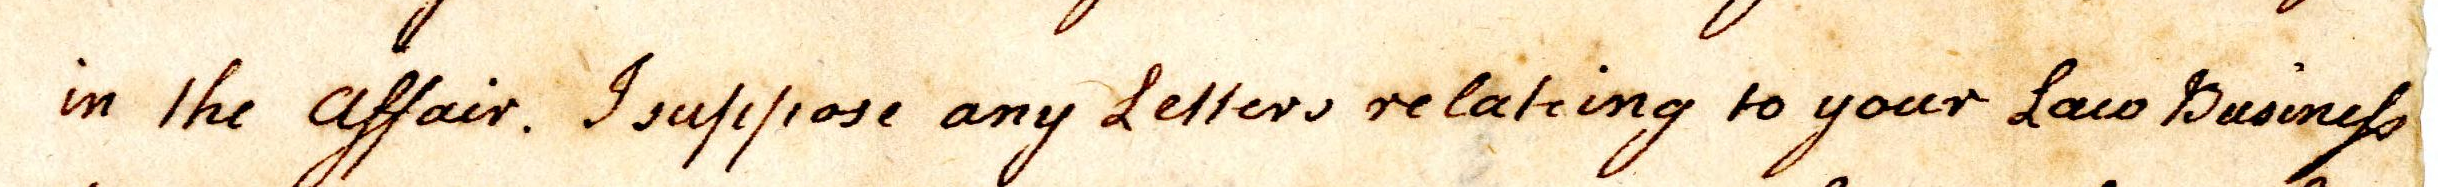in the affair. I suppose any Letters relating to your Law Business
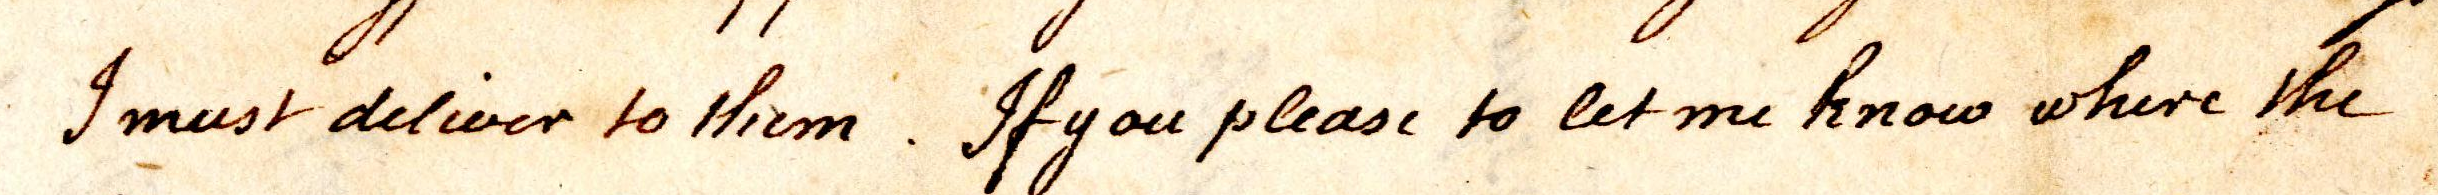I must deliver to them. If you please to let me know where the
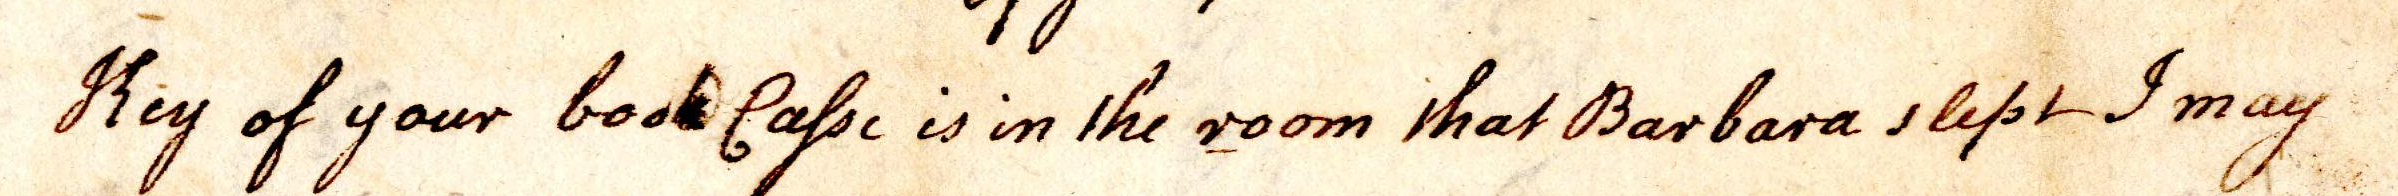Key of your book Casse is in the room that Barbara slept I may
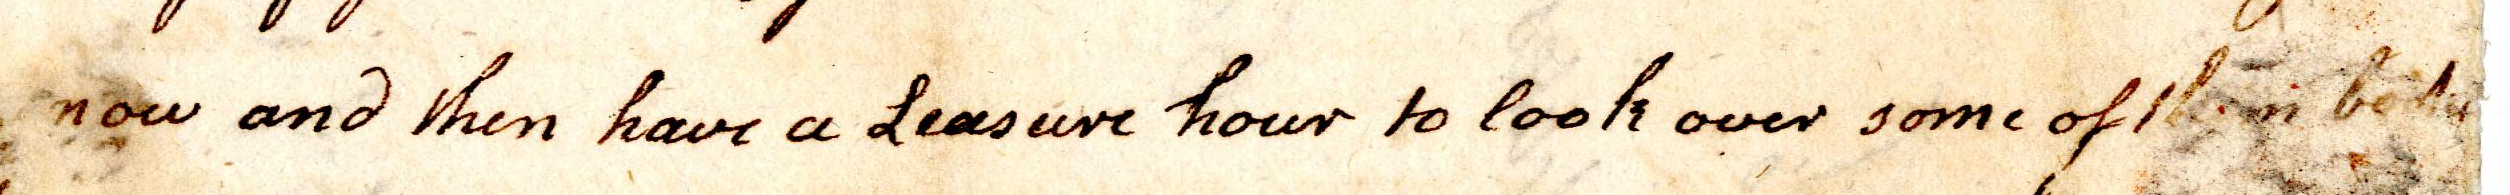now and then have a Leasure hour to look over some of those books
